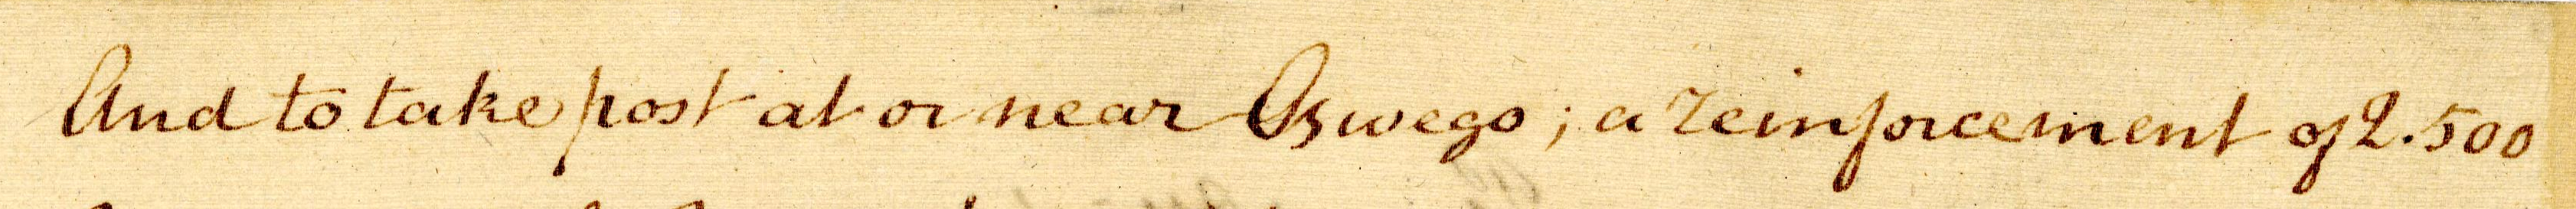And to take post at or near Oswego; a reinforcement of 2.500
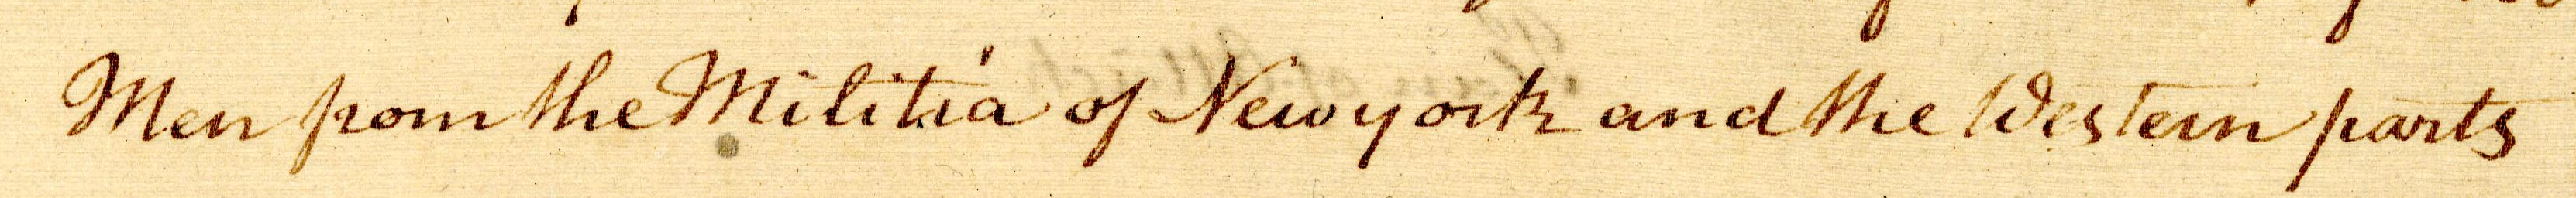Men from the Militia of New york and the Western parts
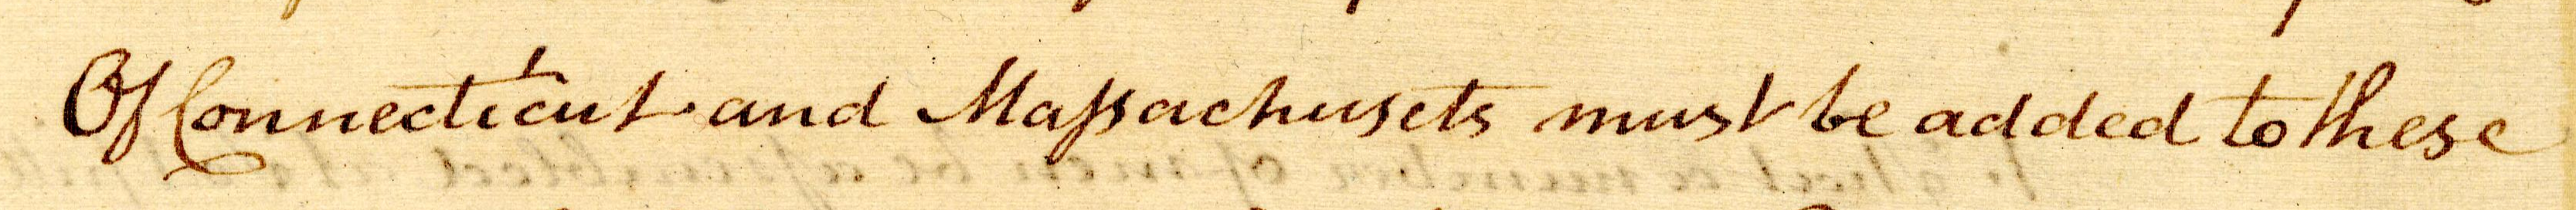Of Connecticut and Massachusets must be added to these
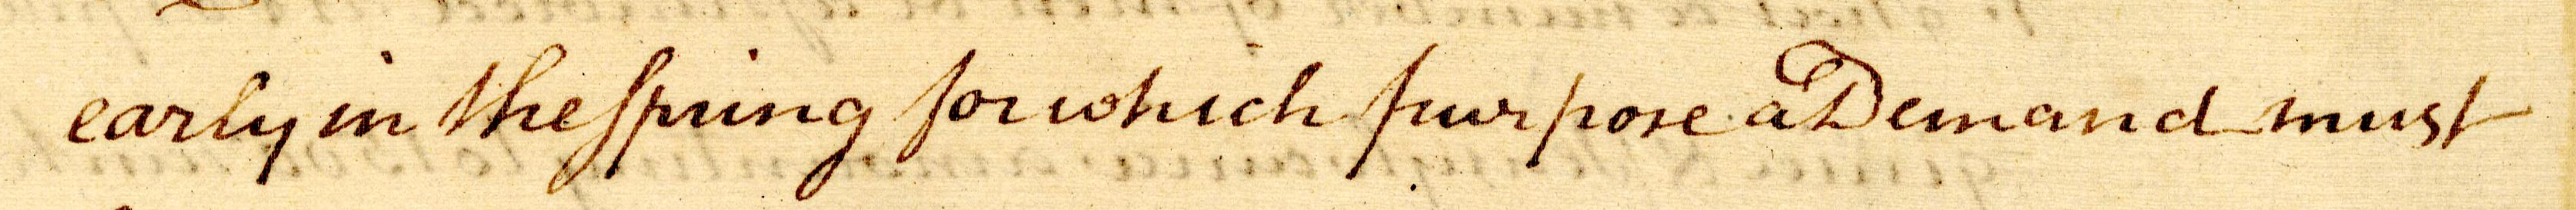early in the spring for which purpose a Demand must
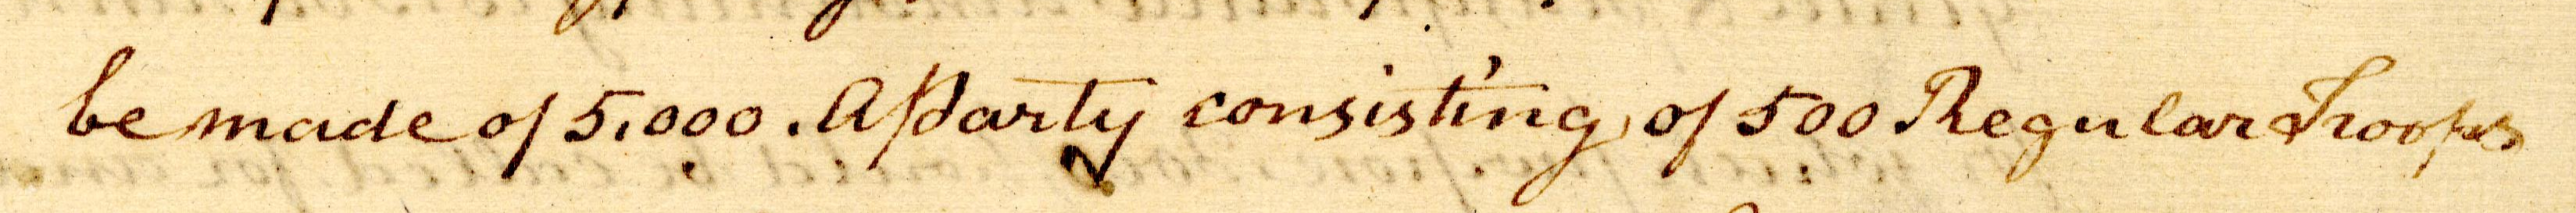be made of 5.000. A Party consisting of 500 Regular Troop
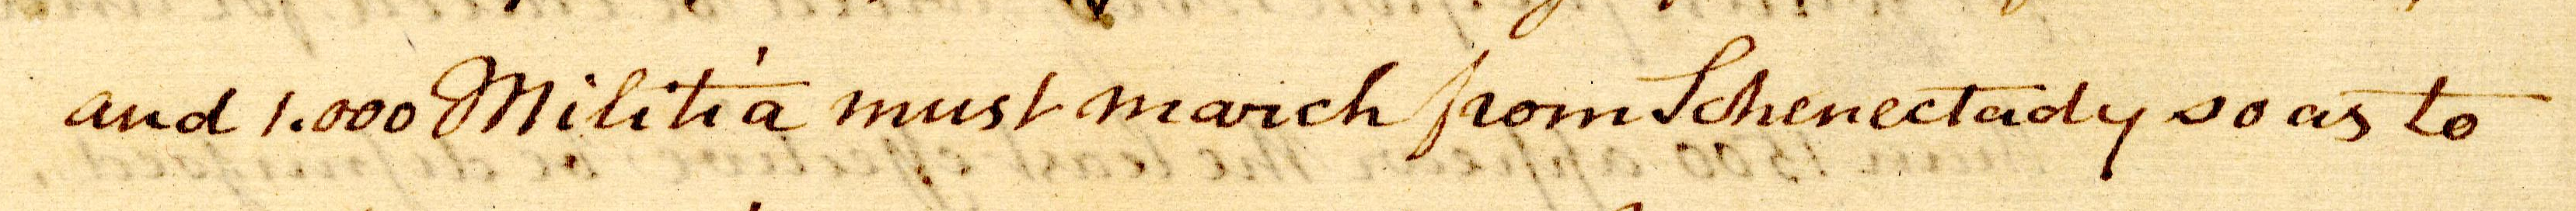and 1.000 Militia must march from Schenectady so as to
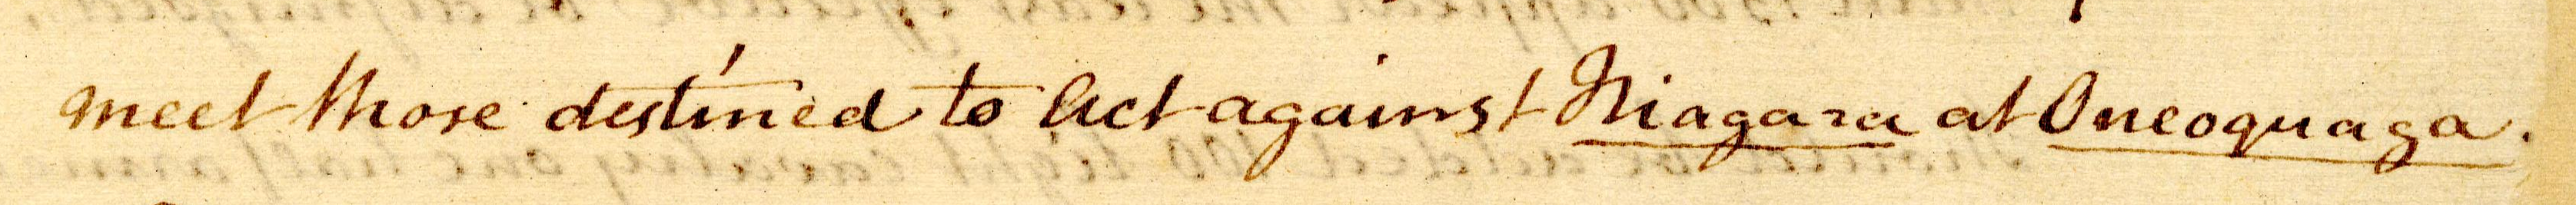meet those destined to Act against Niagara at Oncoquaga.
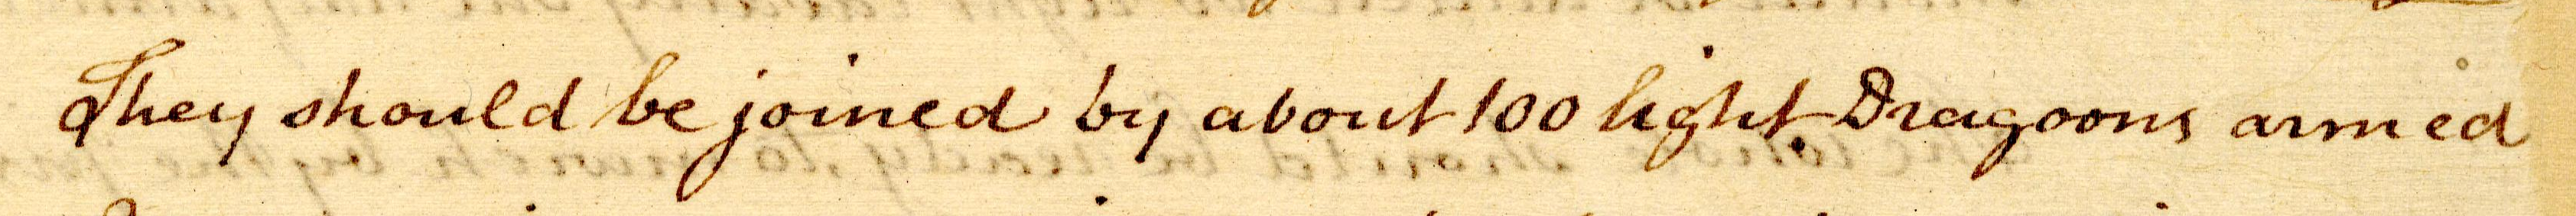They should be joined by about 100 light Dragoons armed
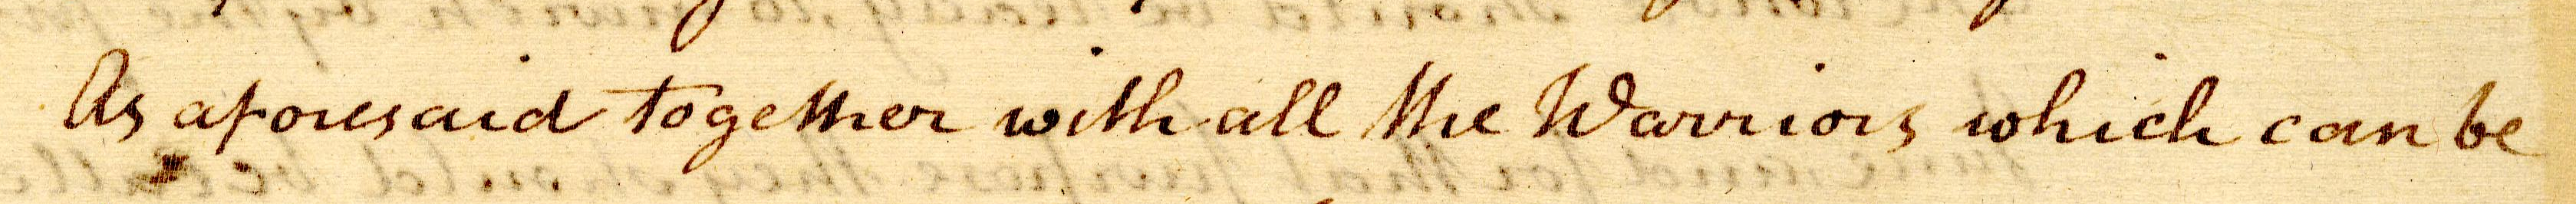As aforesaid together with all the Warriors which can be
